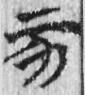亥
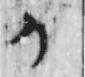人
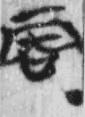丙
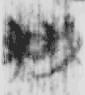杋
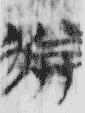劵
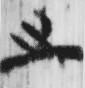之
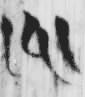州
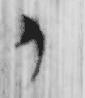人
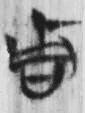周
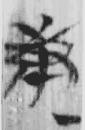庚
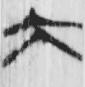大
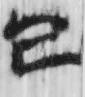己
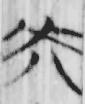癸
